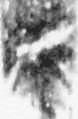○（屨）
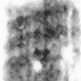三
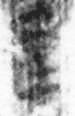良（兩）
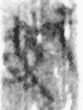○（鞔）
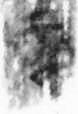○（屨）
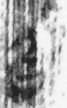皆
